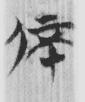伓
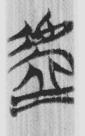虛
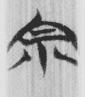宗
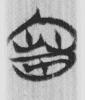{宀苗}
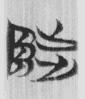陟
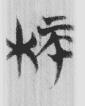{木帀}
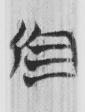於
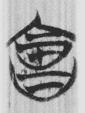會
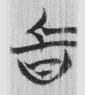旨
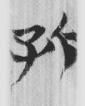孤
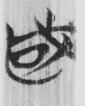或
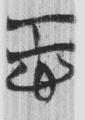{工心}
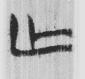亡
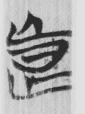良
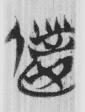僕
